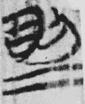則（則）
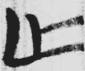亡（無）
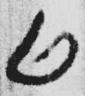㠯（以）
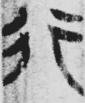行
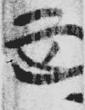正（政）
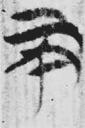不
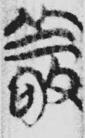敬
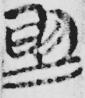則（則）
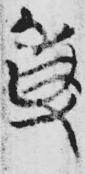事
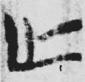亡（無）
